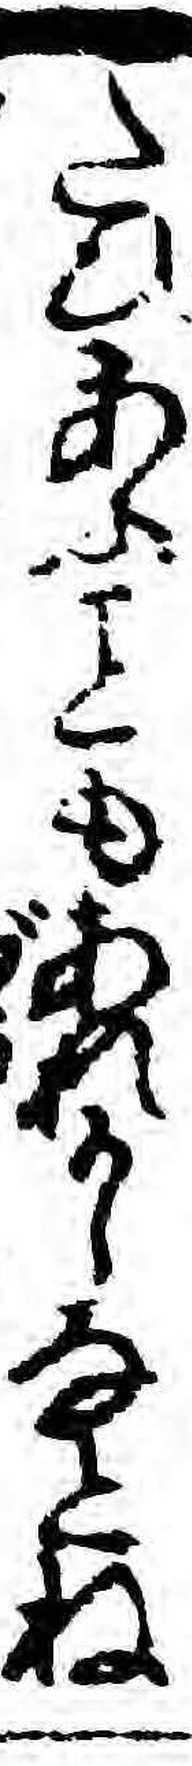たびあふこともあれかしなとね
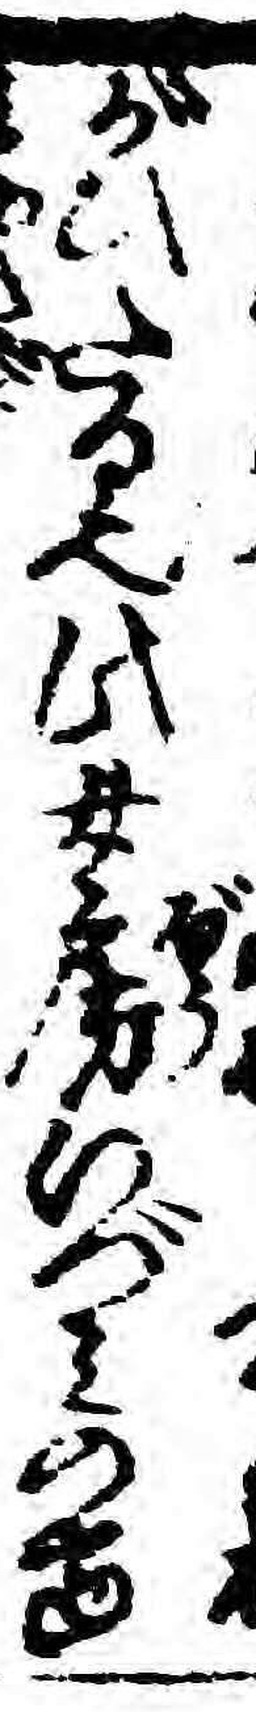がひたる也此の女房いづみの守
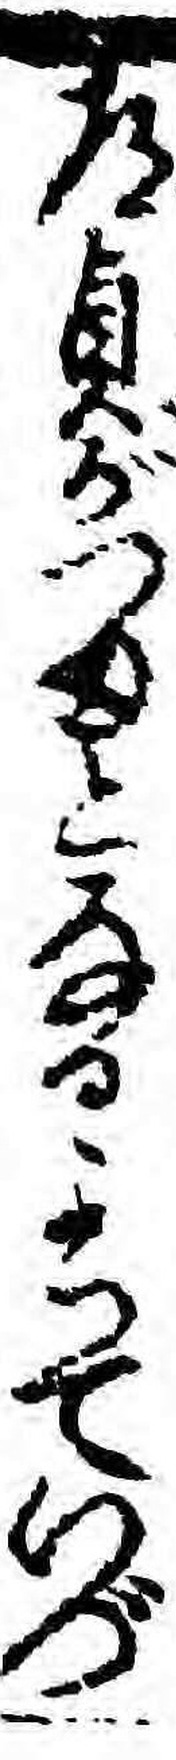道貞がつまとなるよつていづ
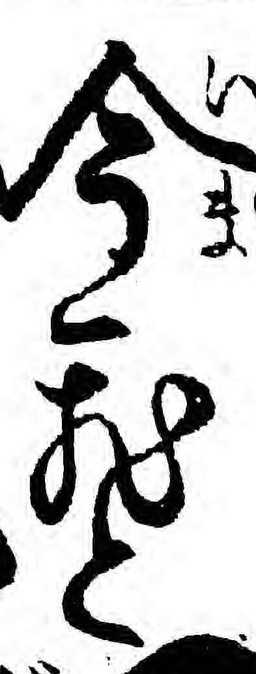今ひと
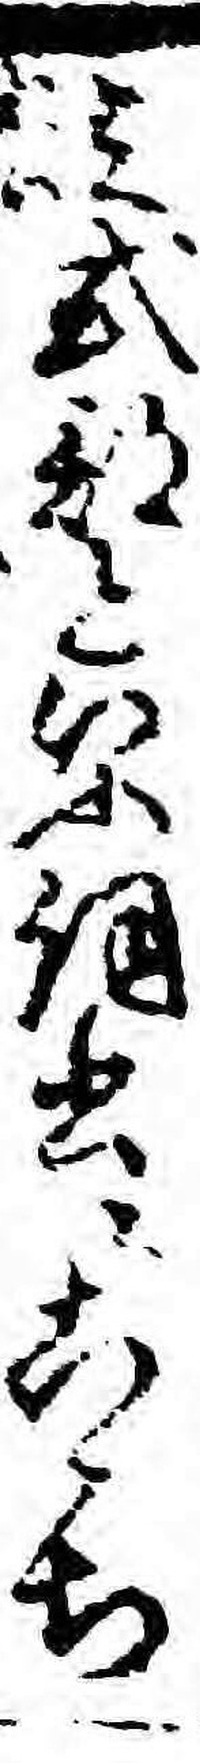み式部といふ詞書にこゝち
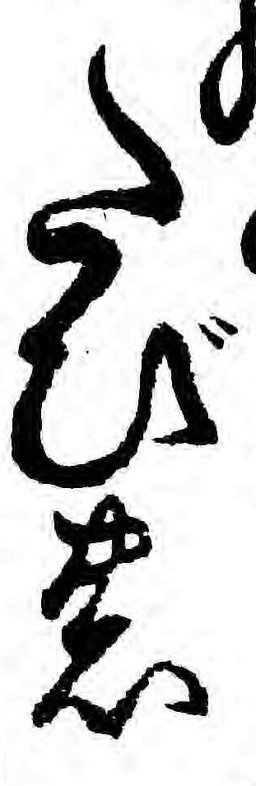たびの
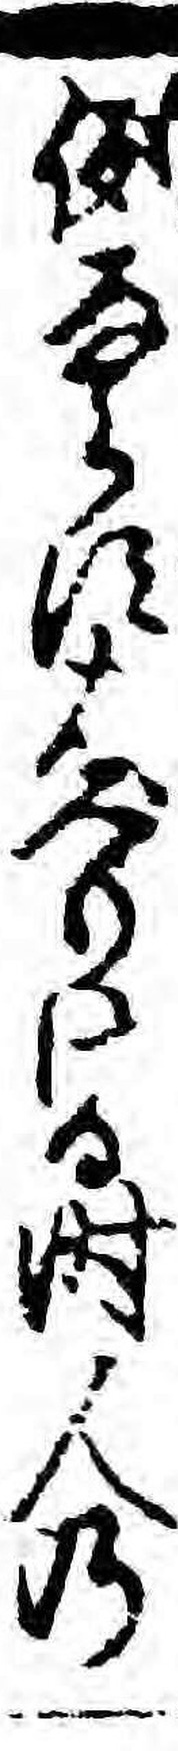例ならずはべりける時人の
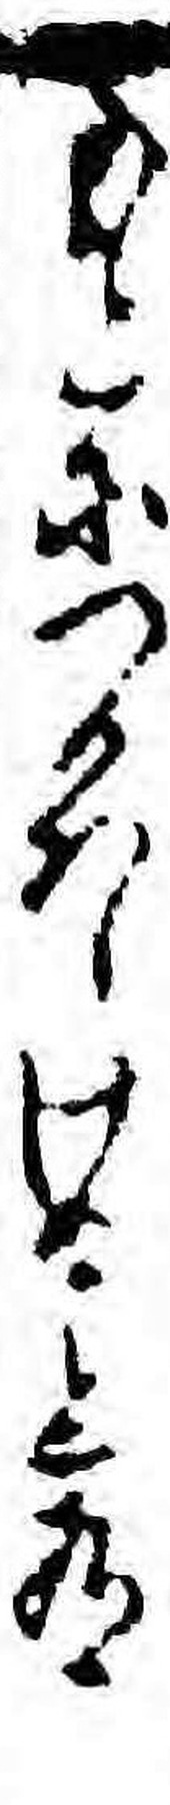もとにつかはしけると有
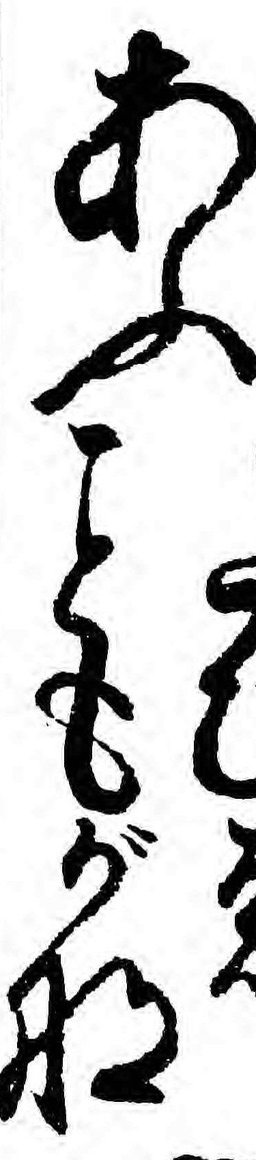あふこともがな
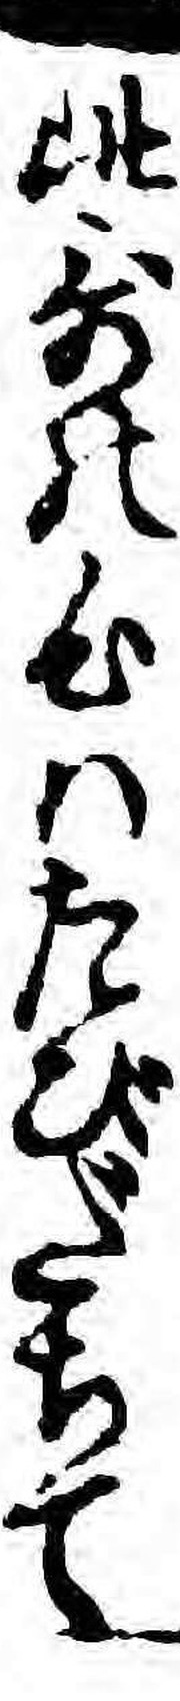此哥の心はたびだちて
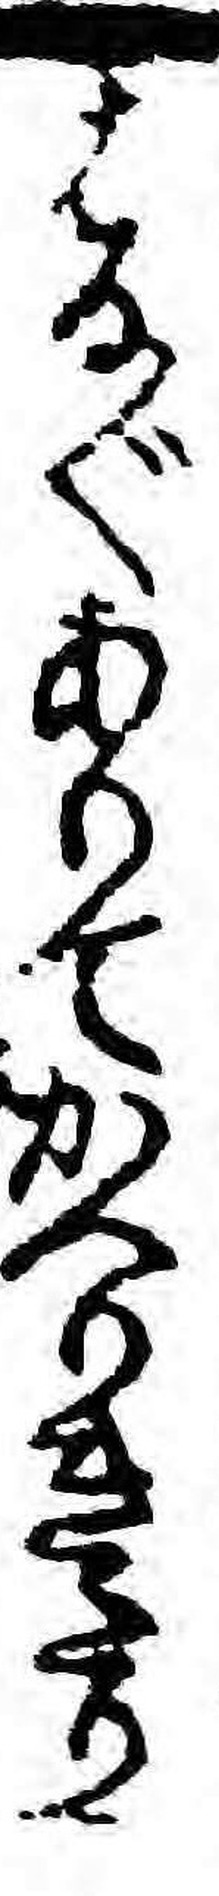はる〴〵ありてかへりきたり
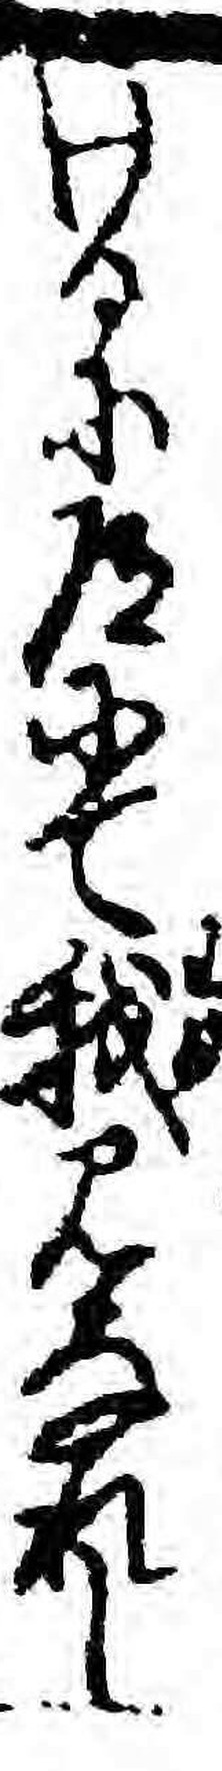けるに道にて我見なれし
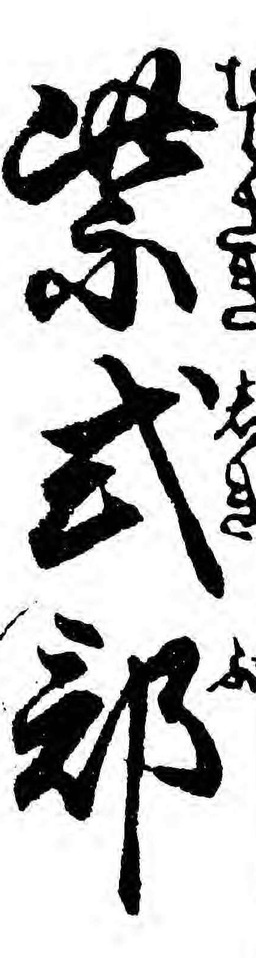紫式部
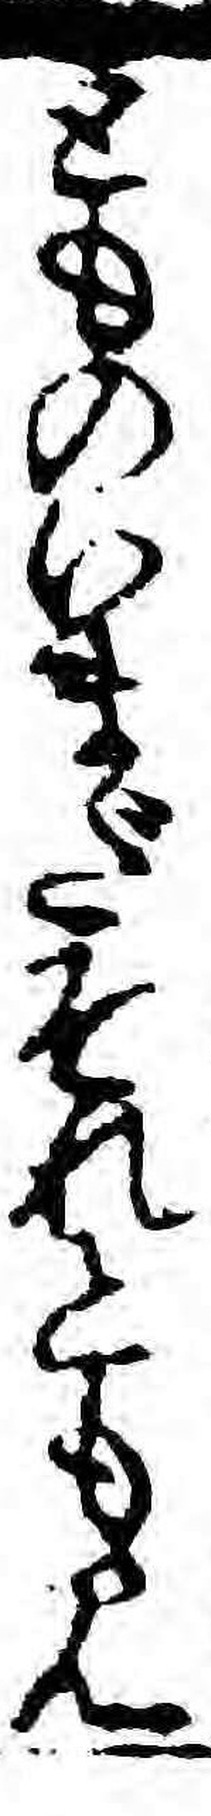とものいまだそれとも見
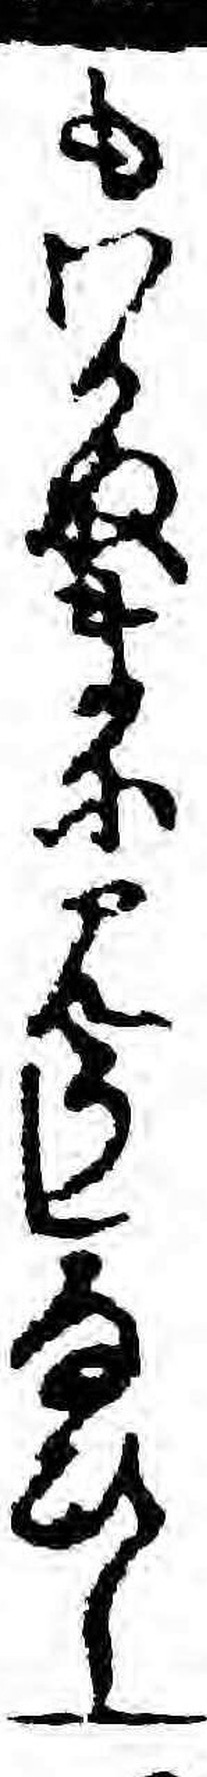もわかぬまに見うしなひし
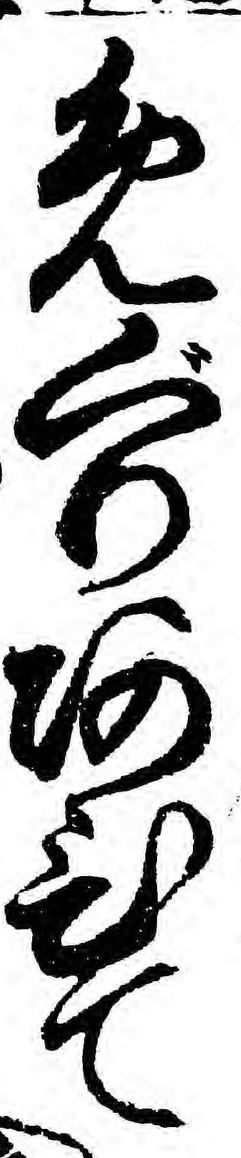めぐりあひて
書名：頭書和歌注譯／壽賀多百人一首小倉錦
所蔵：国文学研究資料館
